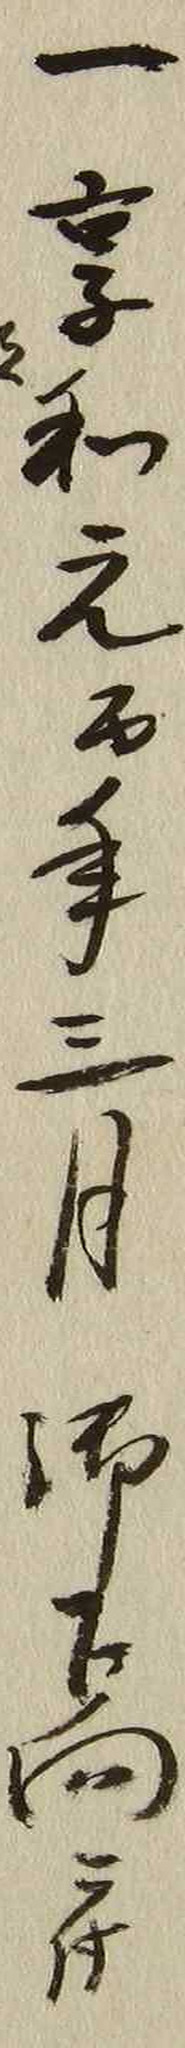一享和元酉年三月御下向ニ付
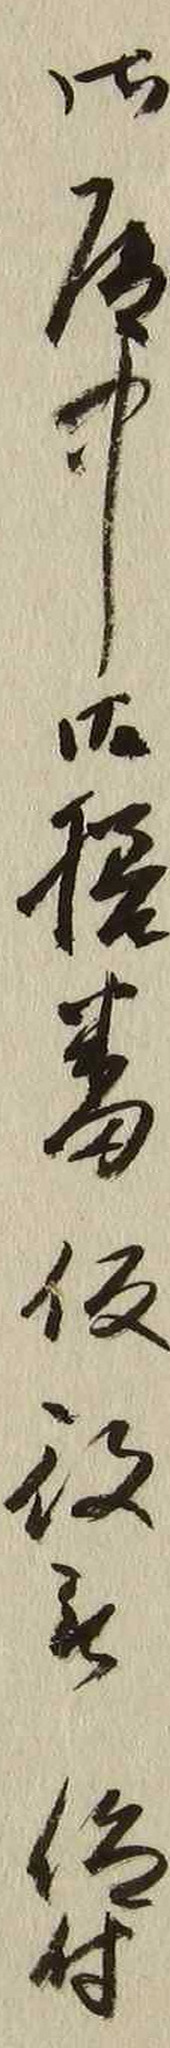御道中御膳番仮役被仰付
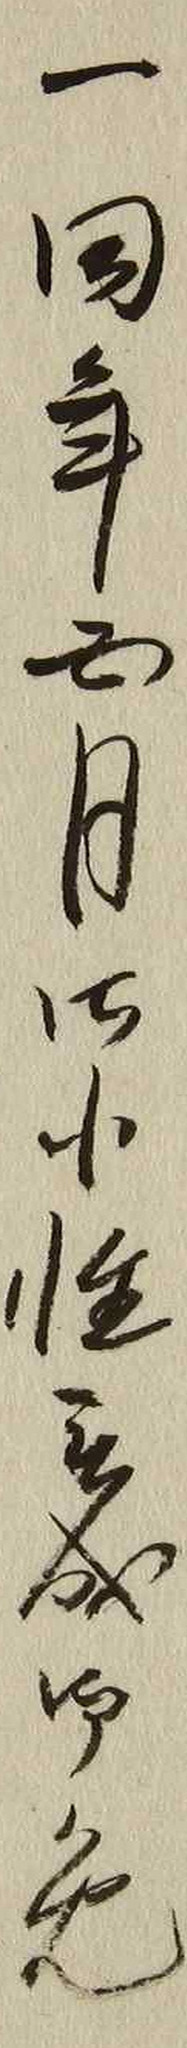一同年五月御小性被成御免
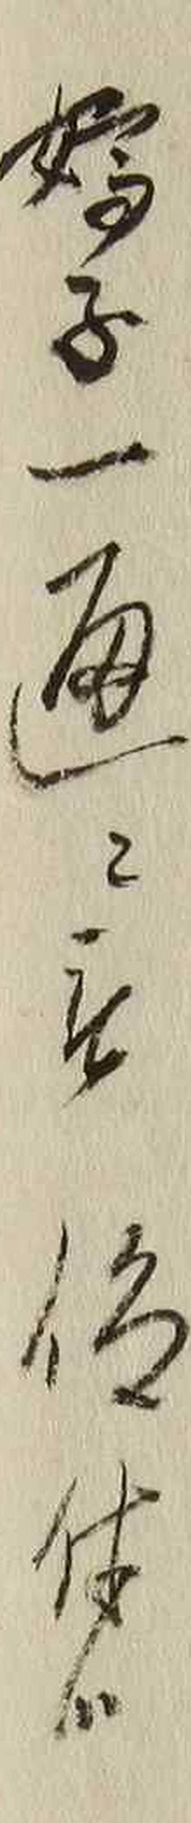嫡子一通ニ被仰付候
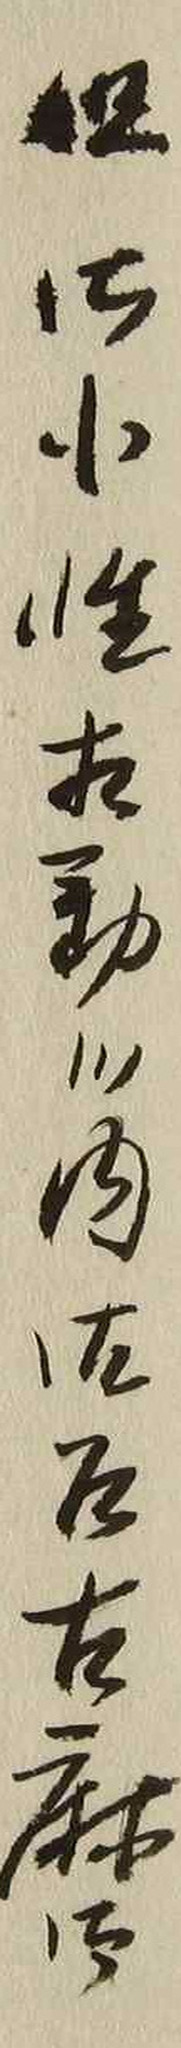但御小性相勤候内御召古麻御
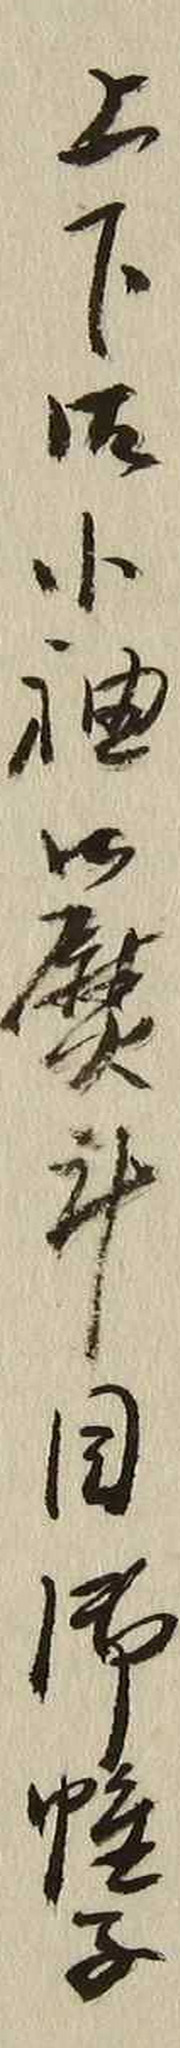上下御小袖御熨斗目御帷子
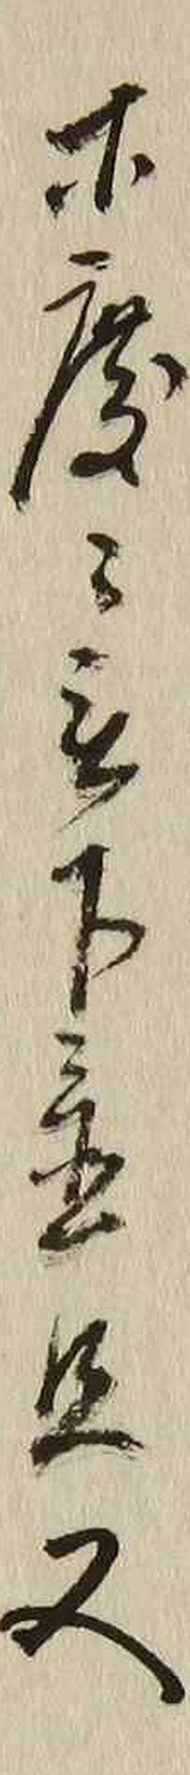等度々被下置且又
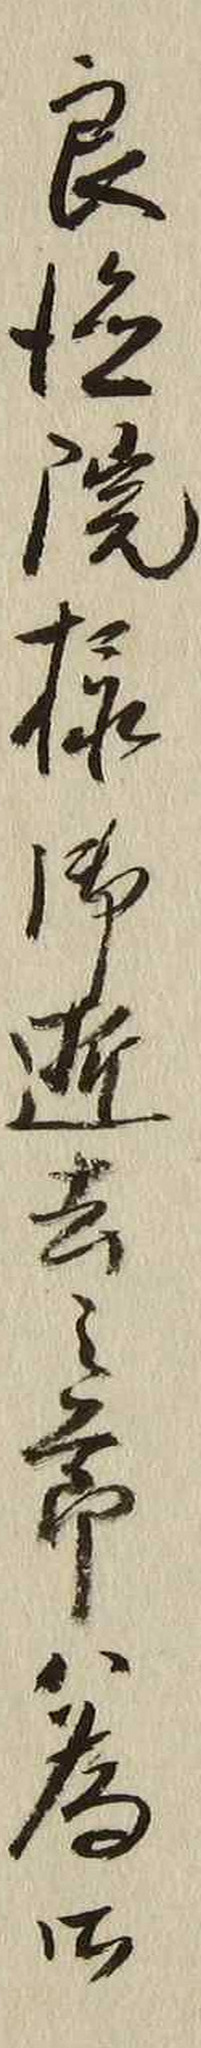良徳院様御逝去之節ハ為御
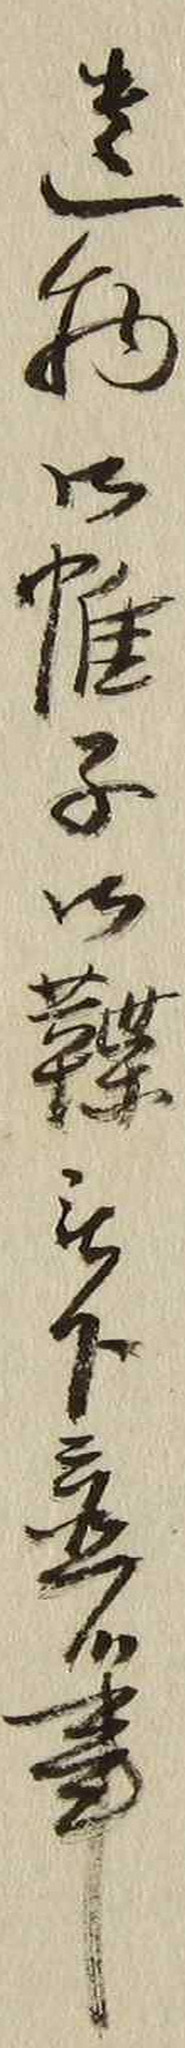遺物御帷子御鞢被下置候事
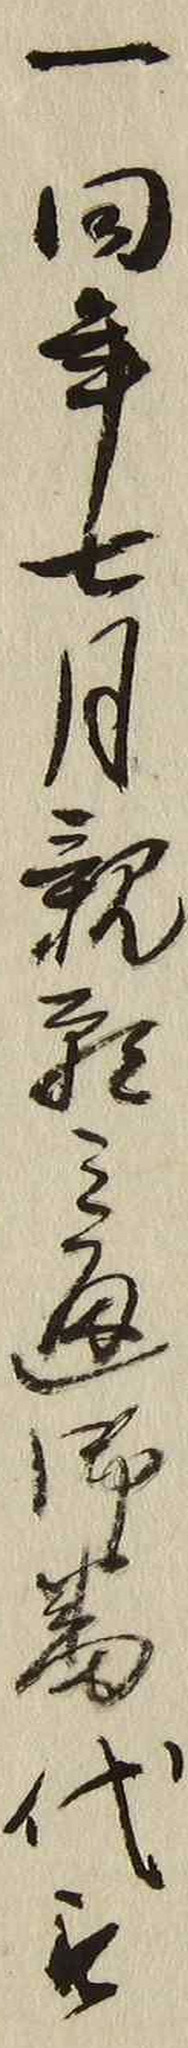一同年七月親願之通御番代被
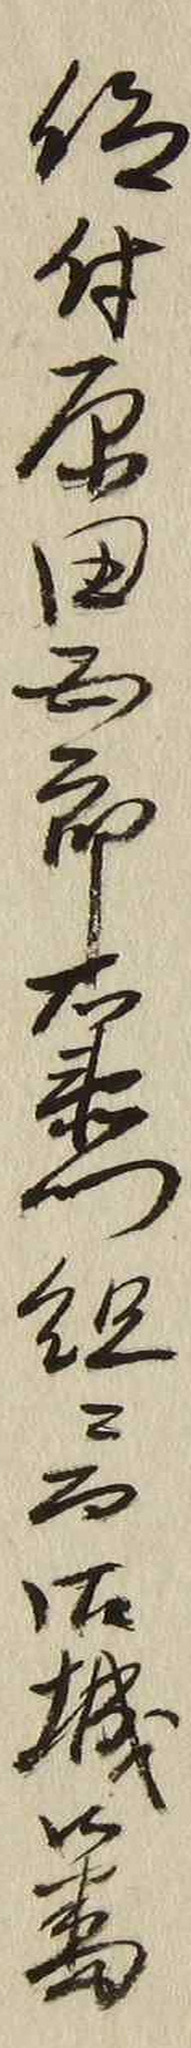仰付原田五郎右衛門組ニ而御城御番
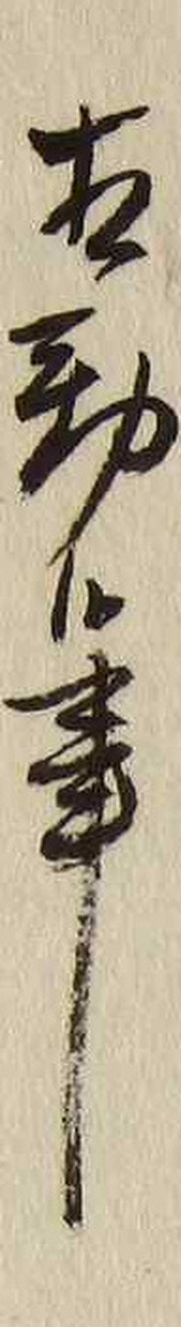相勤候事
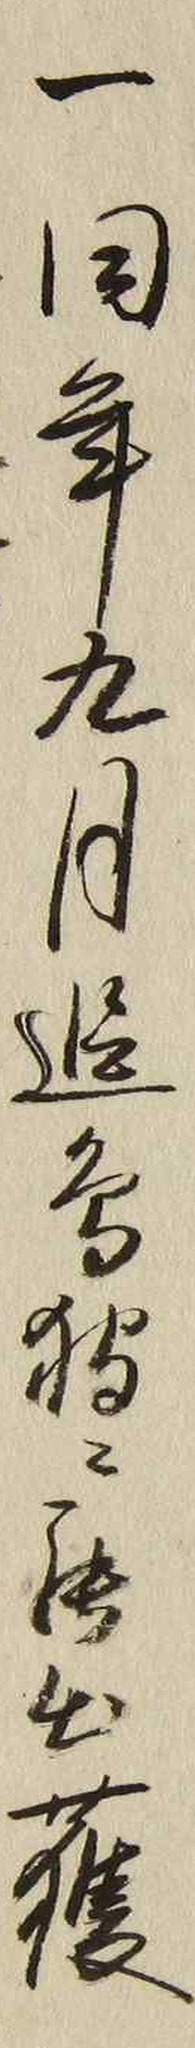一同年九月追鳥狩ニ罷出獲
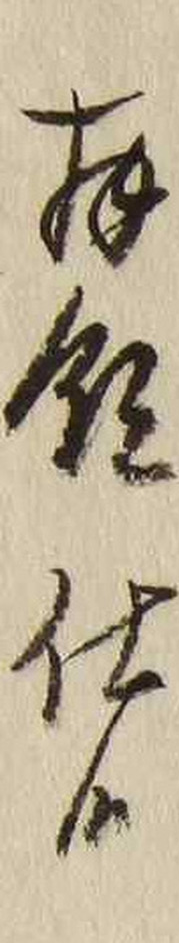拝領仕候

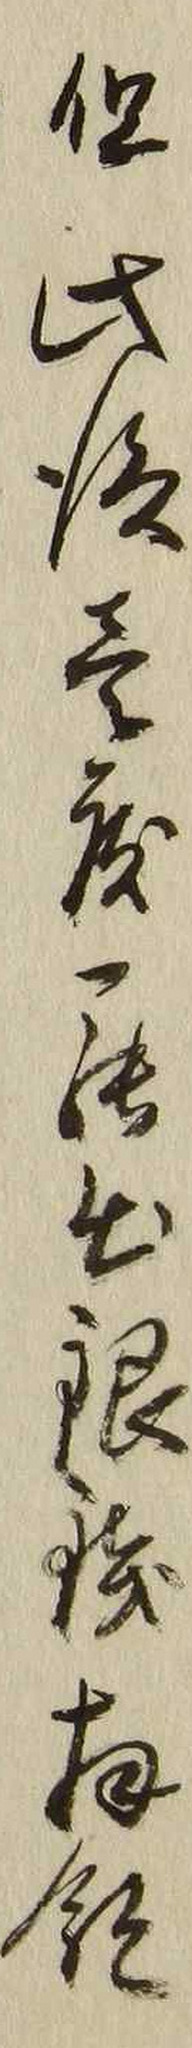但此後壱度罷出銀銭拝領
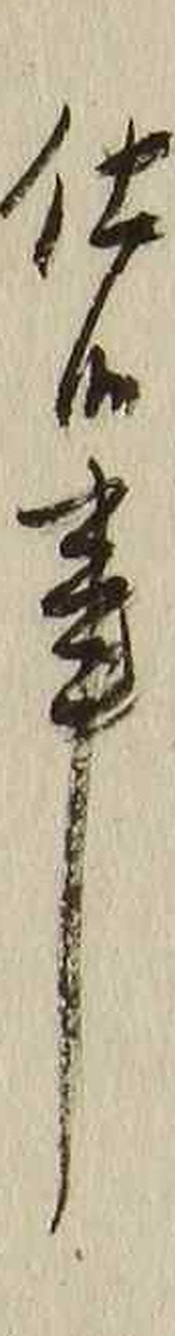仕候事
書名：諸士系譜　巻之346　も之部2
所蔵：会津若松市立会津図書館
